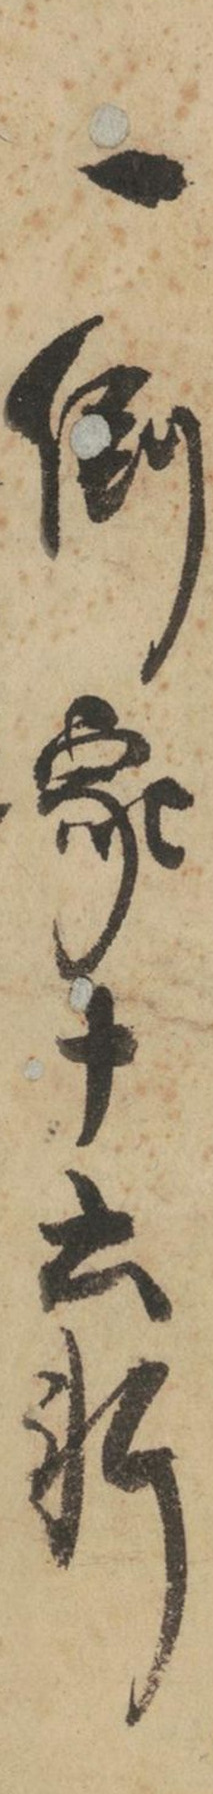一倒屋十六軒
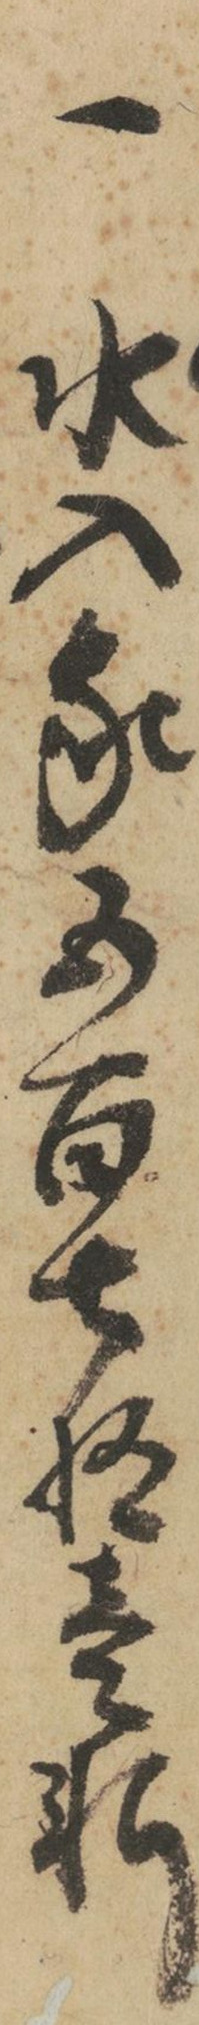一水入家五百七拾壱軒
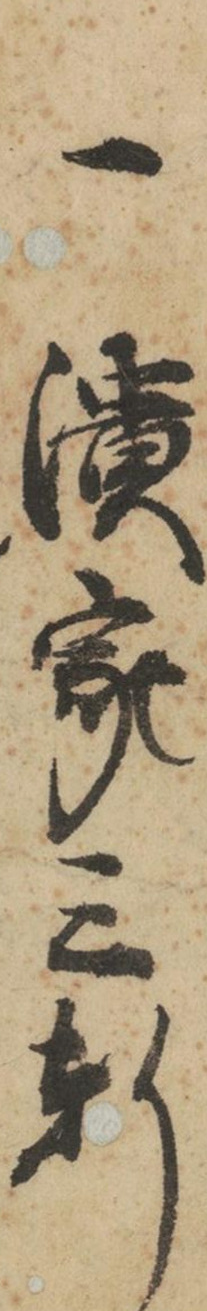一潰家三軒
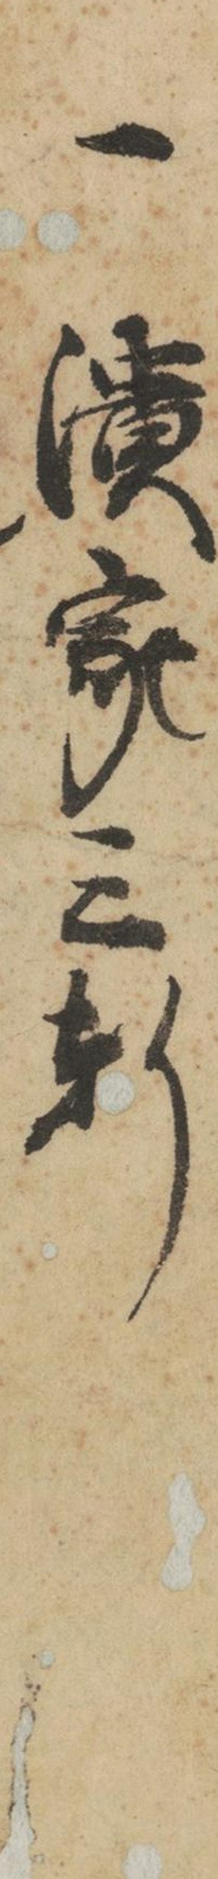一潰家三軒
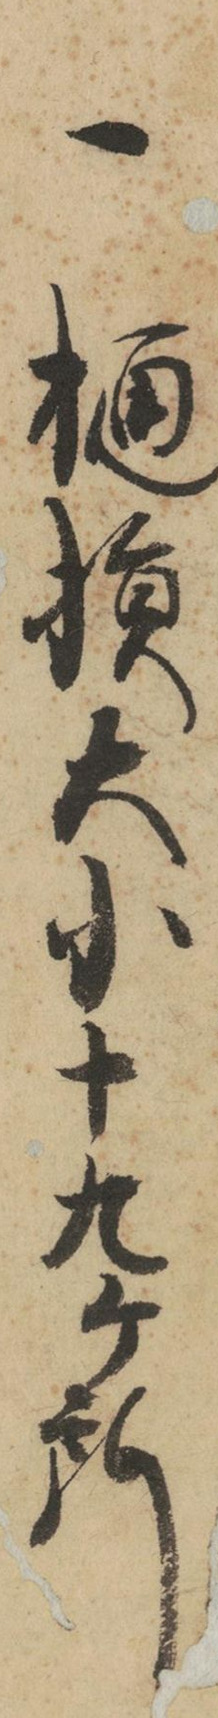一樋損大小十九ヶ所
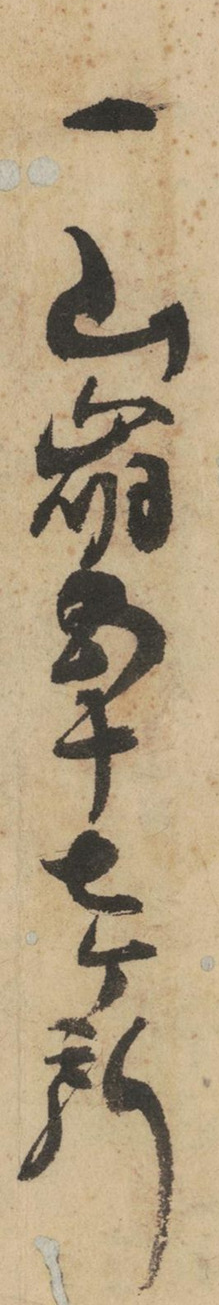一山崩五十七ヶ所
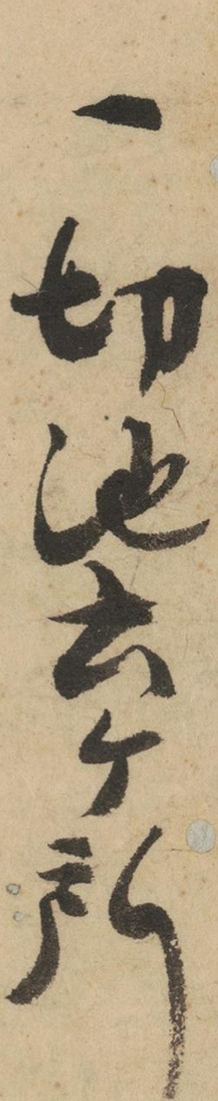一切池六ヶ所
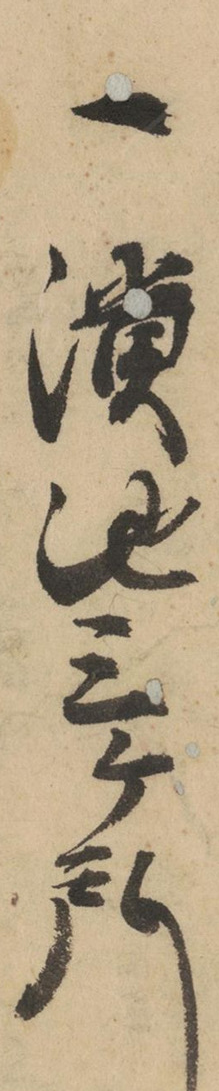一潰池三ヶ所
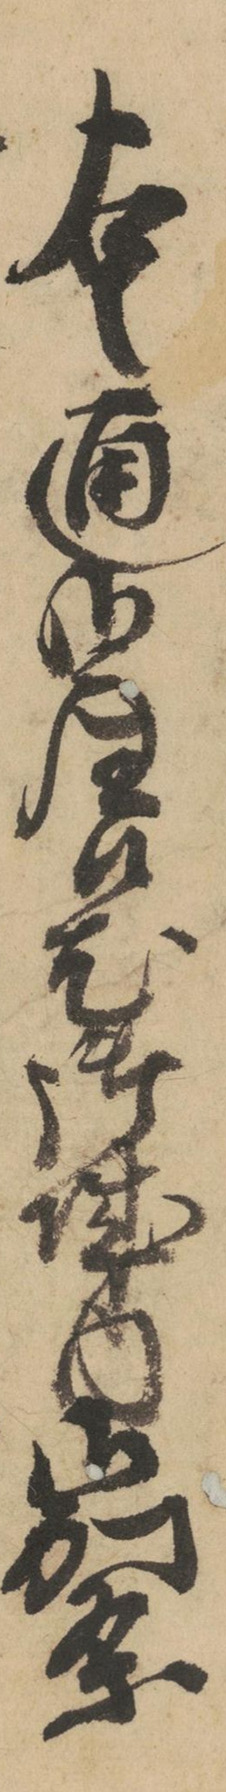右之通御座候尤御城内御別条
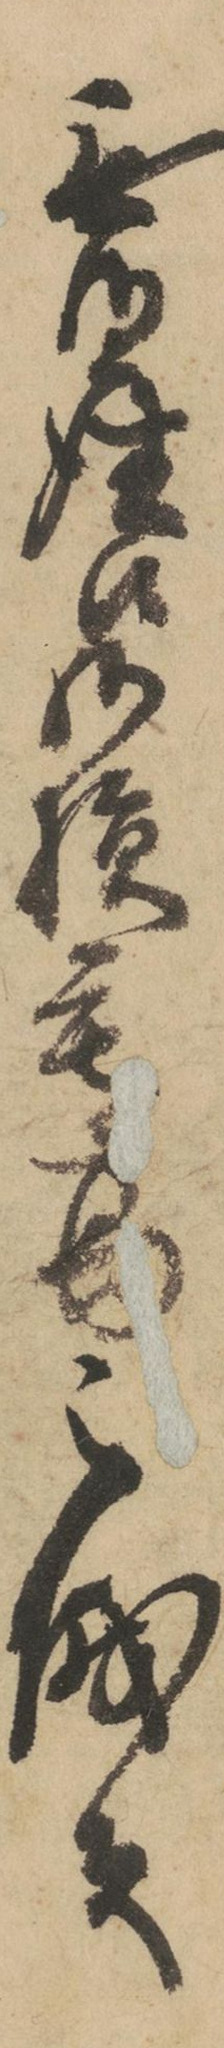無御座候御損毛高之儀者
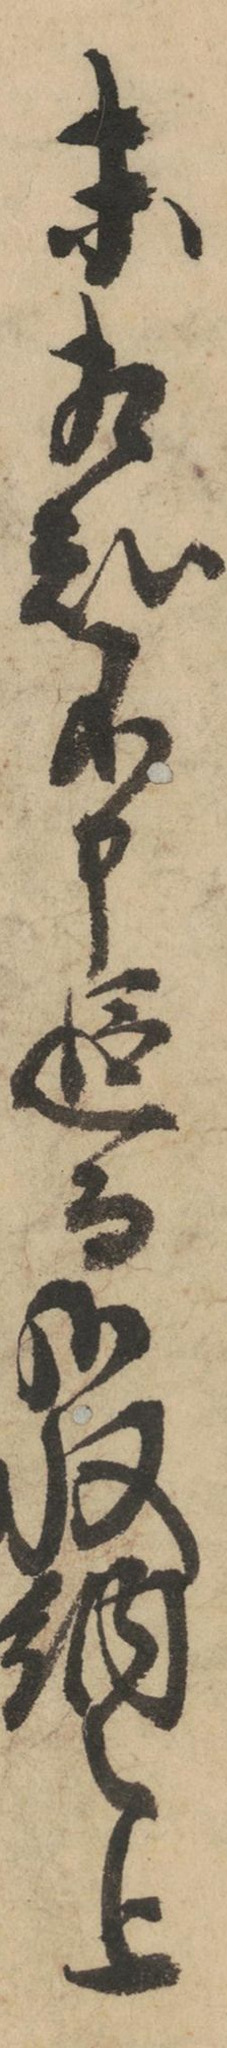未相知不申追而御収納之上
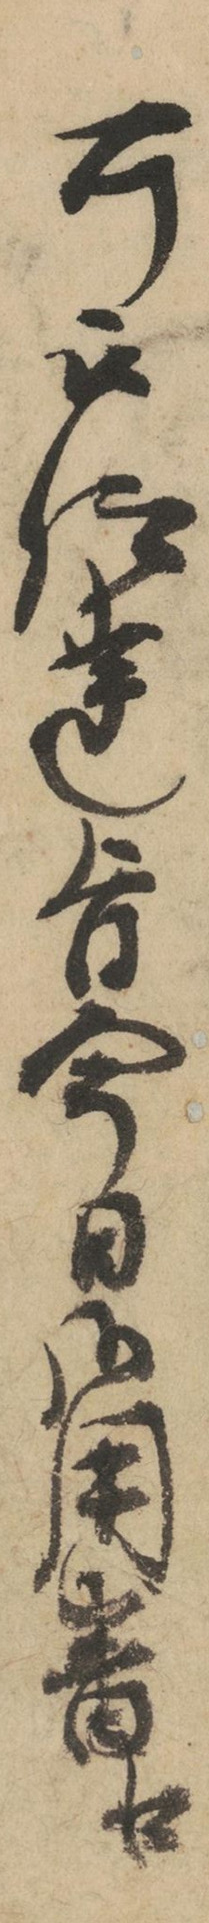右被仰達旨今日御用番江
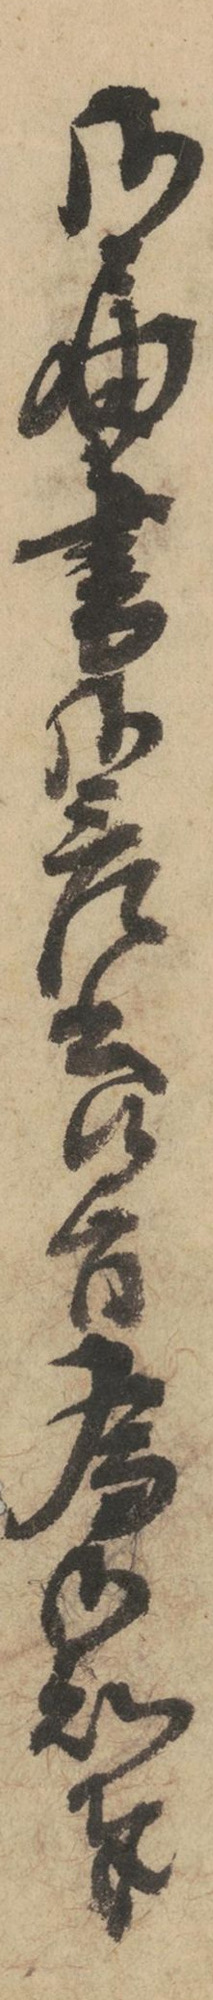御届書御差出候間為御知奉
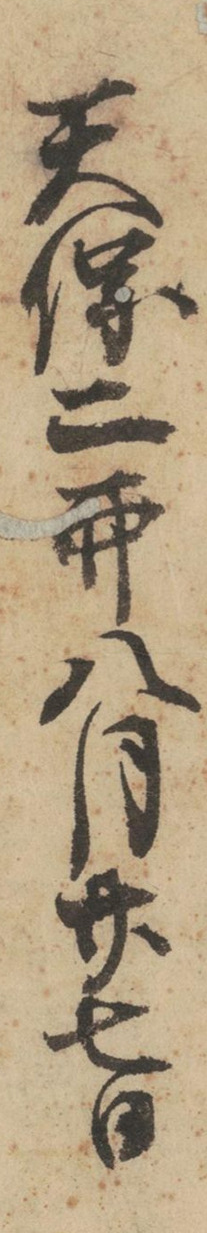天保二卯八月廿七日
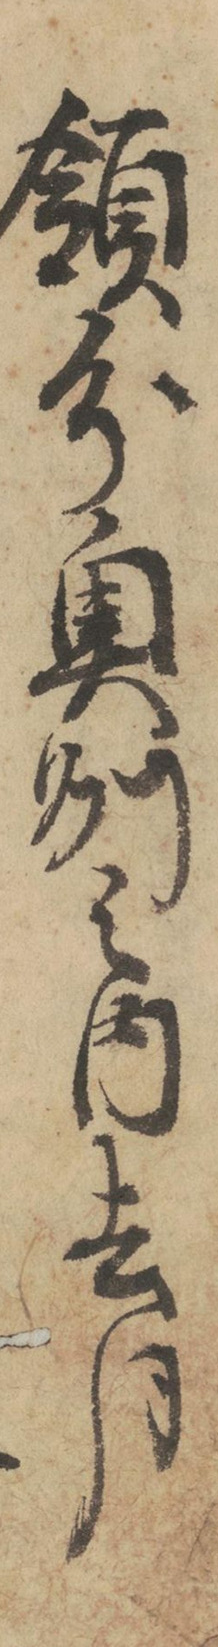領分奥州之内去月
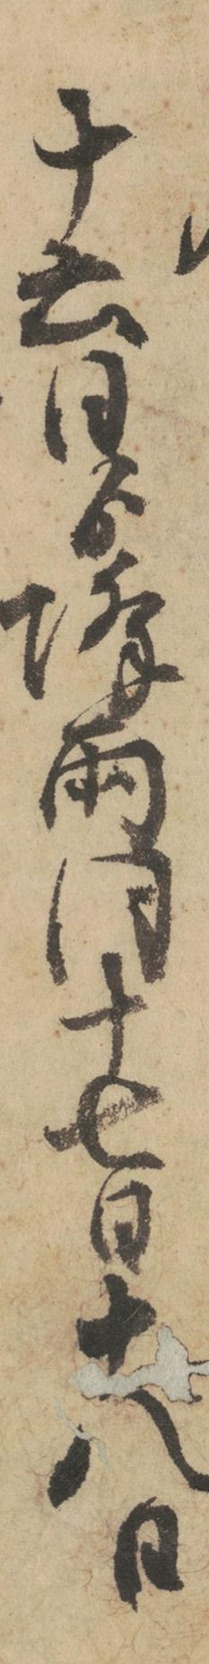十六日ゟ降雨同十七日十八日
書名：[紀州藩災害記録]
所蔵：東京大学地震研究所図書室 Earthquake Research Institute Library, The University of Tokyo, JAPAN
